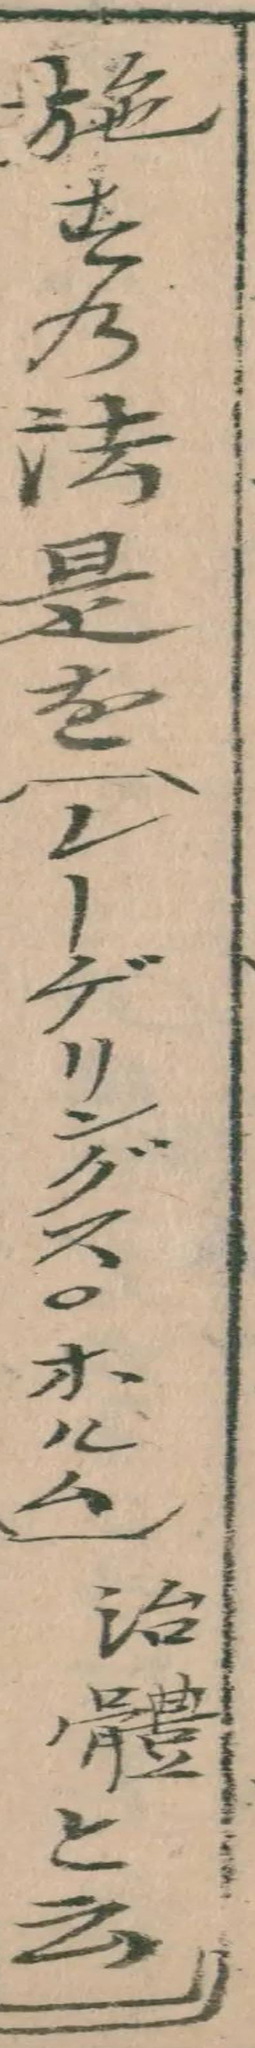施すの法是を(レーゲリングス・ホルム)治体と云))
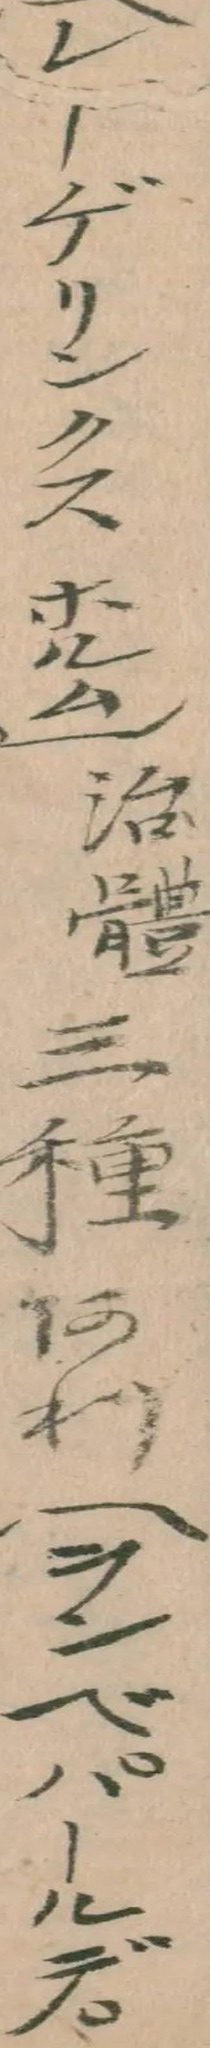(レーゲリンクスホルム)治体三種あり(ヲンベパールデ・

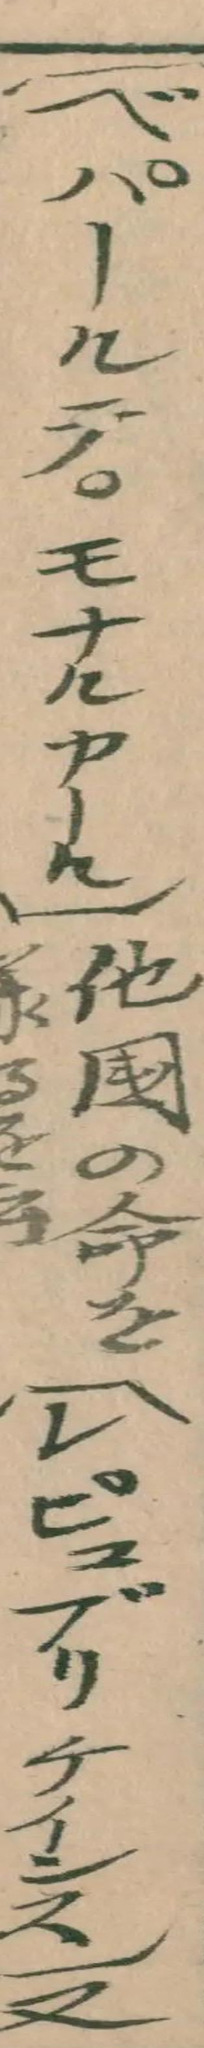(ベパールテ・モナルカール)他国の命を承るを云(レピュブリケインス)又
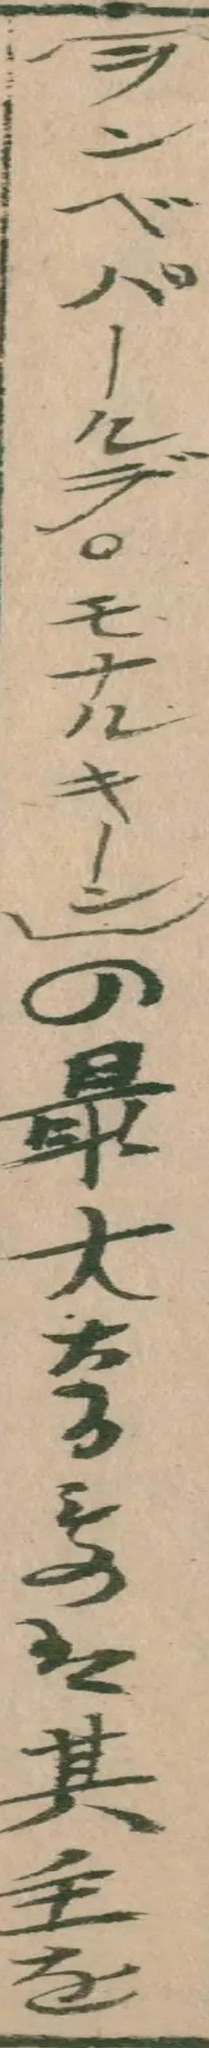(ヲンベパールデ・モナルキーン)の最大なるものは其主を
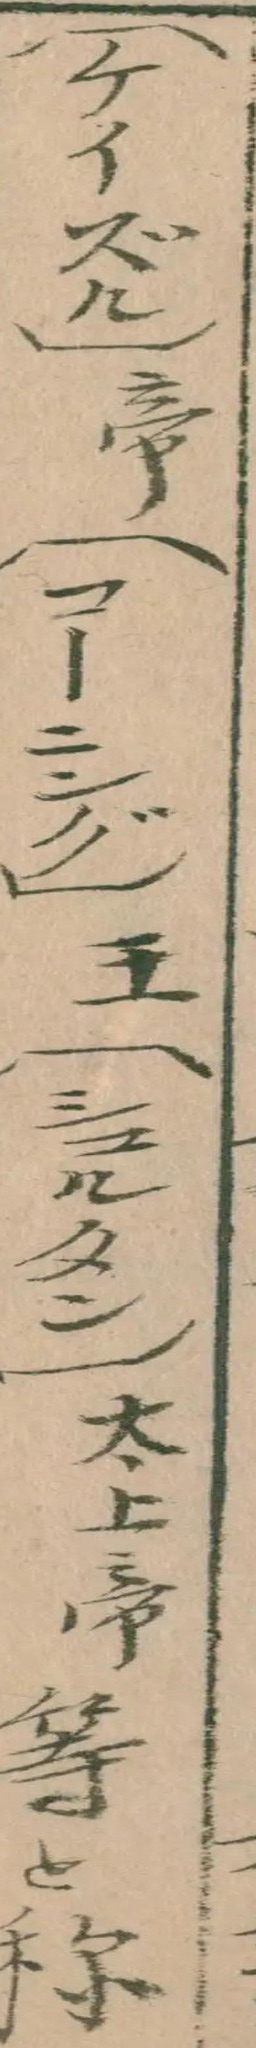(ケイズル)帝(コーニング)王(シュルタン)太上帝等と称
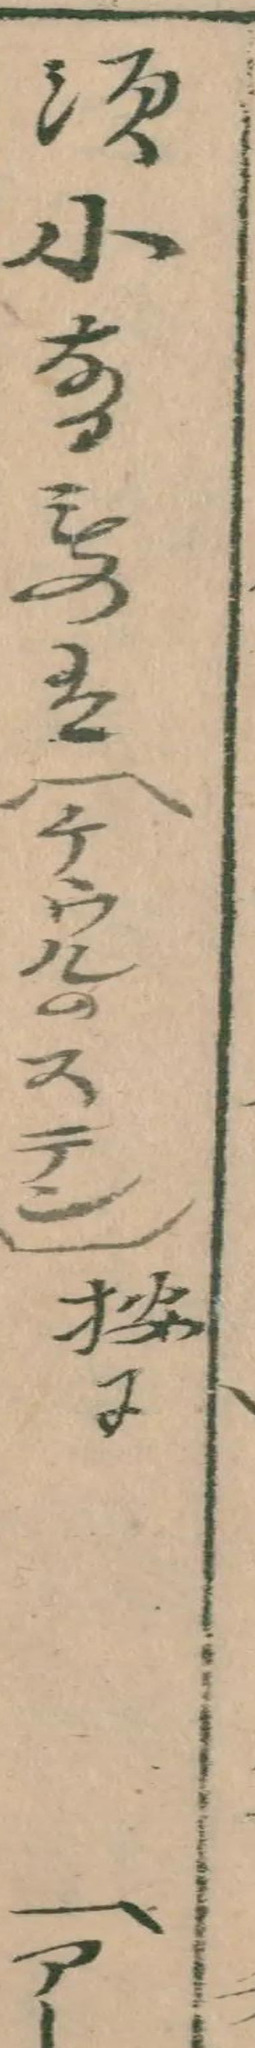す小なるものは(ケウル・ステン)按に(アー
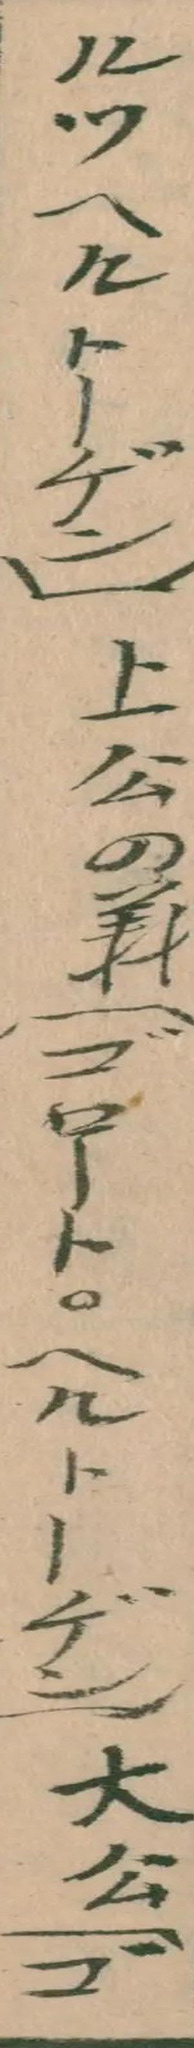ルツヘルトーゲン)上公の義(ゴロート・ヘルトーゲン)大公(ゴ
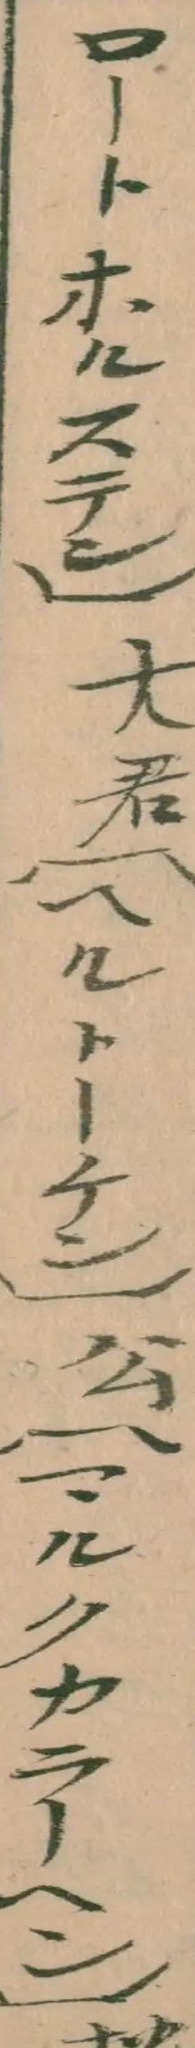ロートホルステン)大君(ヘルトーケン)公(マルクカラーヘン)按
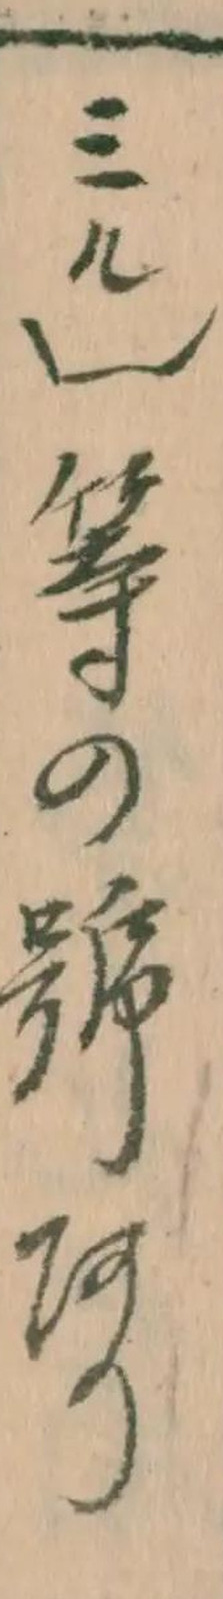ミル)等の号あり
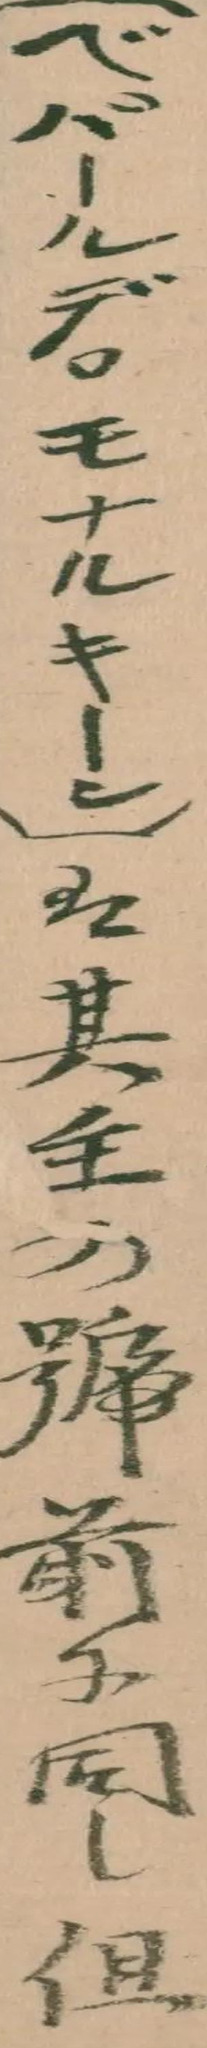(ベパールデ・モナルキーン)は其主の号前に同し但
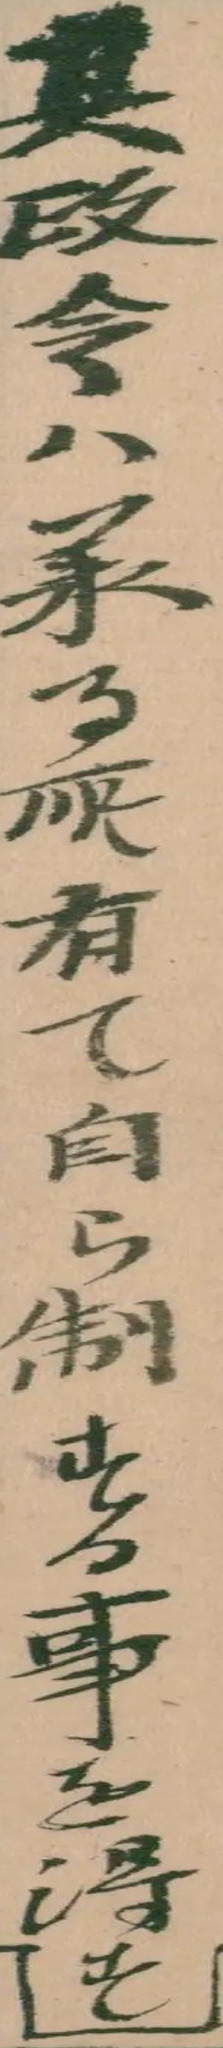其政令ハ承る所有て自ら制する事を得す))
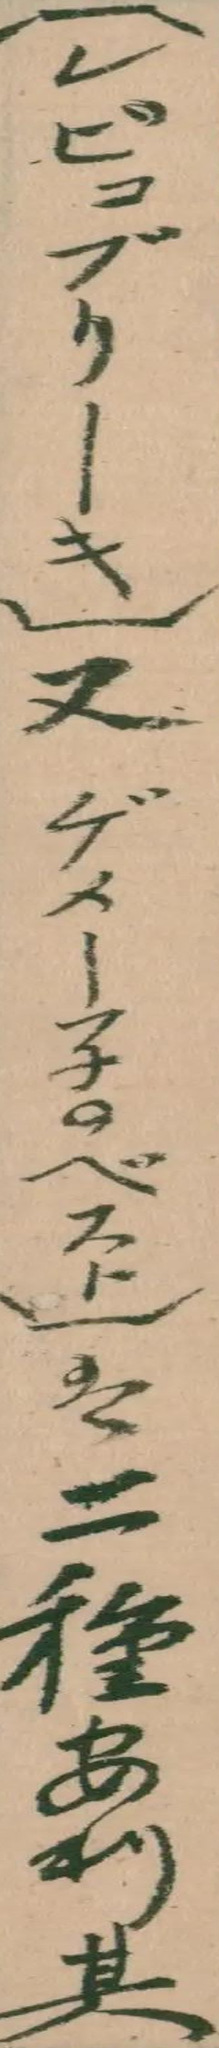(レピュブリーキ)又ゲメーネ・ベスト)は二種あり其
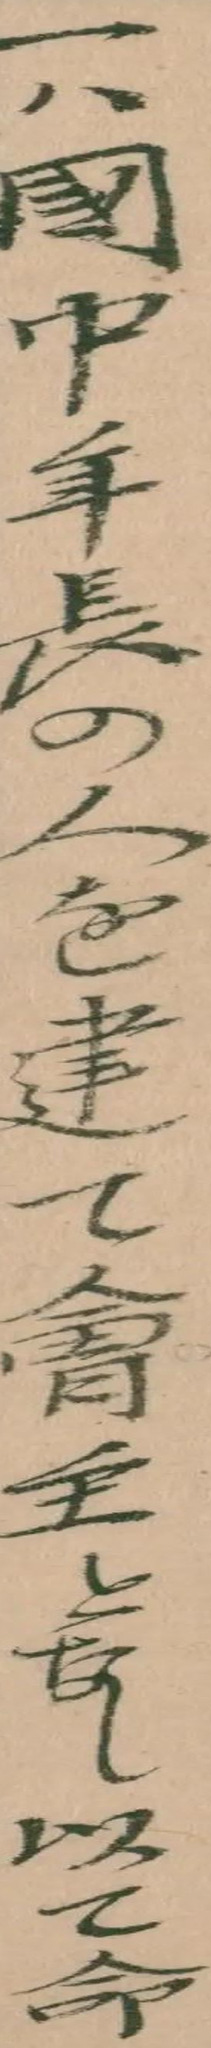一ハ国中年長の人を建て会主となし以て命
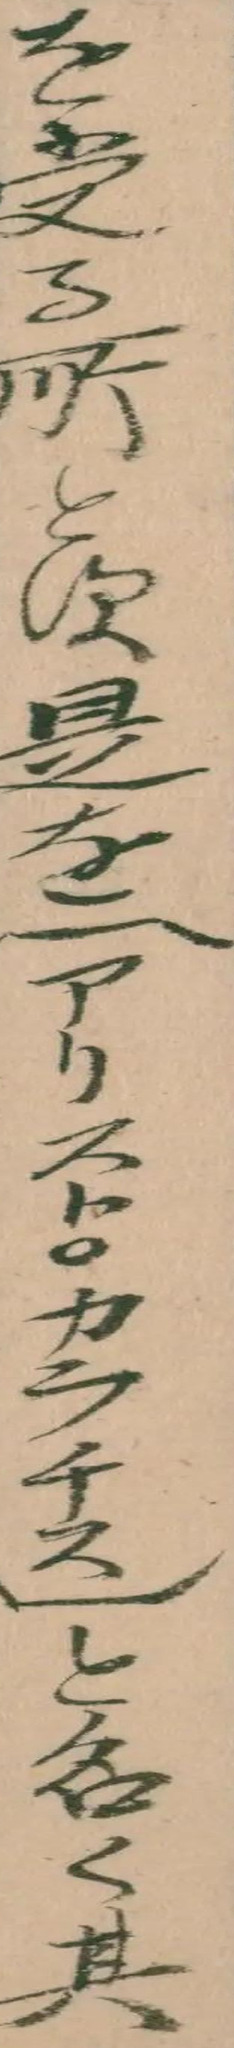を受る所とす是を(アリスト・カラチス)と名く其
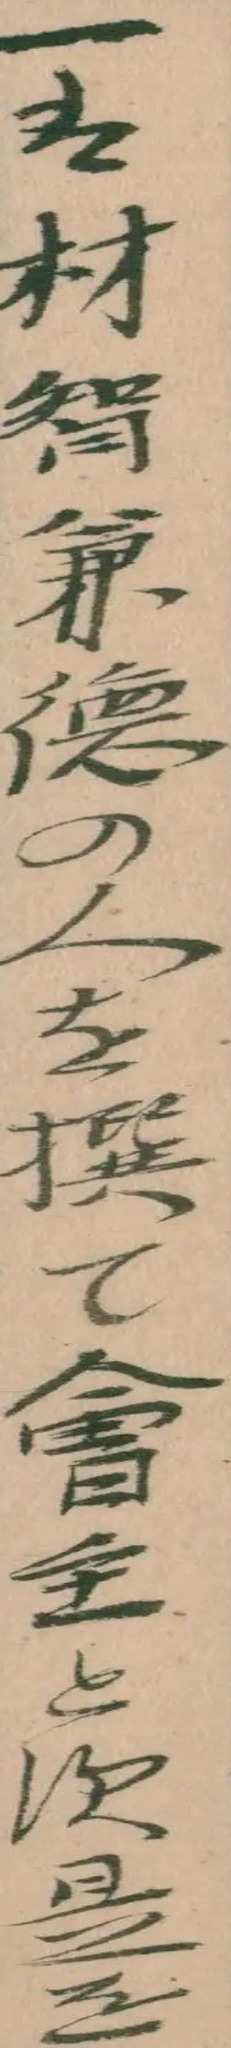一は材智兼徳の人を撰て会主とす是を
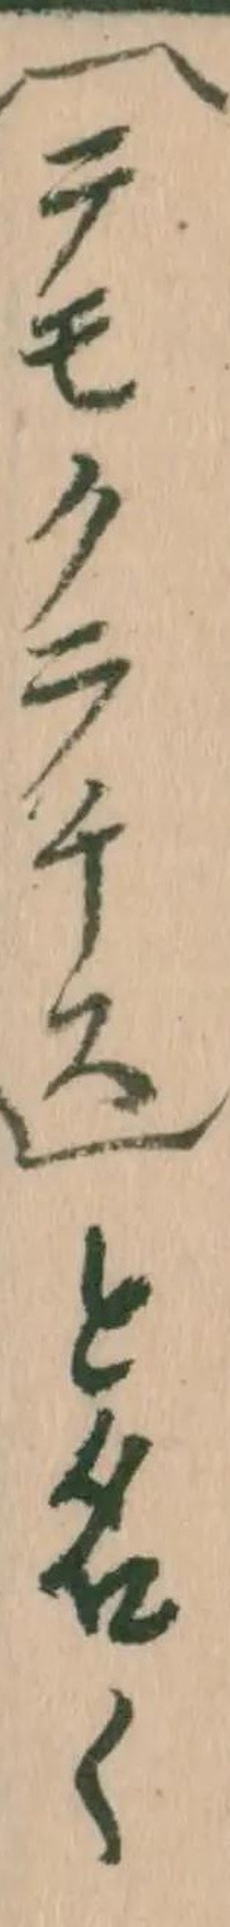(テモクラチス)と名く
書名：新釈輿地図説
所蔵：国立国会図書館 National Diet Library, JAPAN
